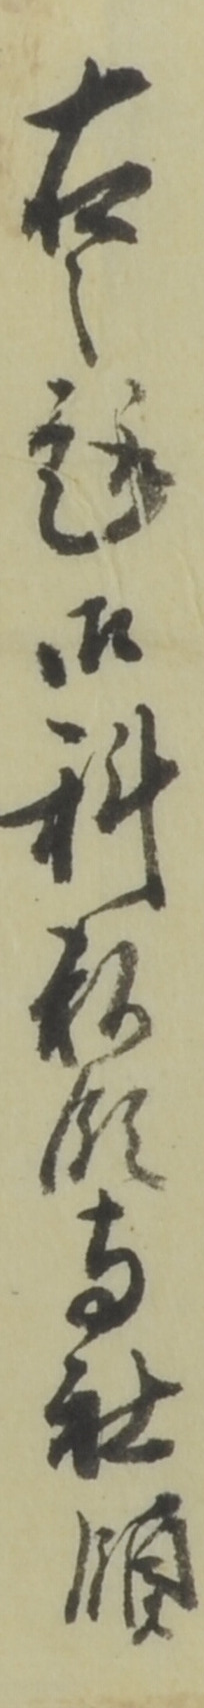右之趣御料私領寺社領
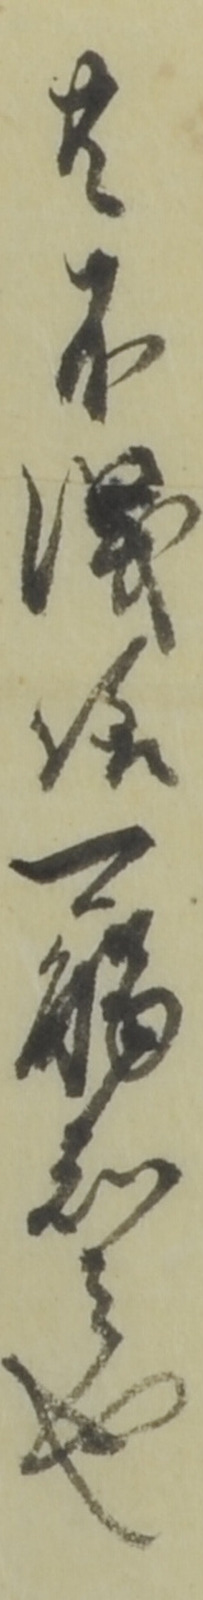共不洩様可触知者也
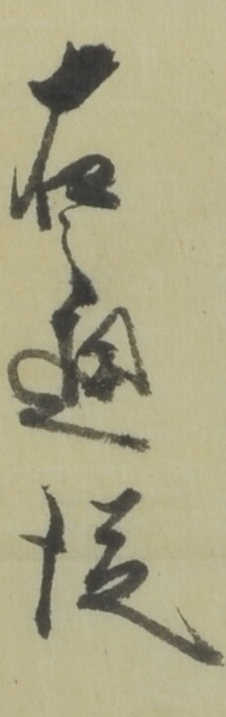右之趣従
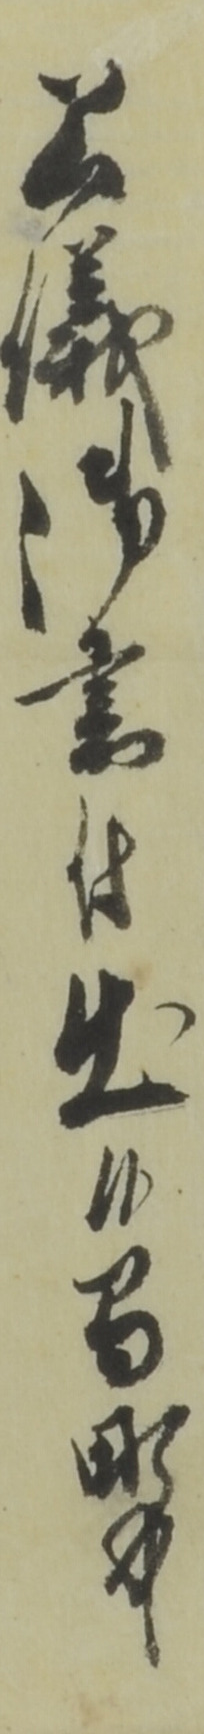公儀御書付出候間町中
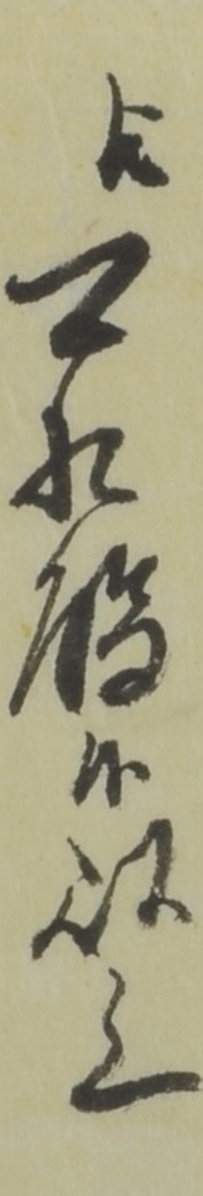江可相触候以上
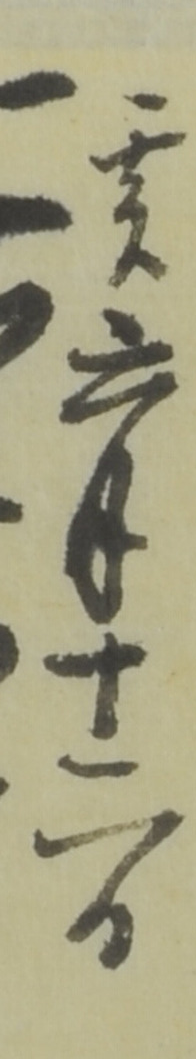亥六月十二日
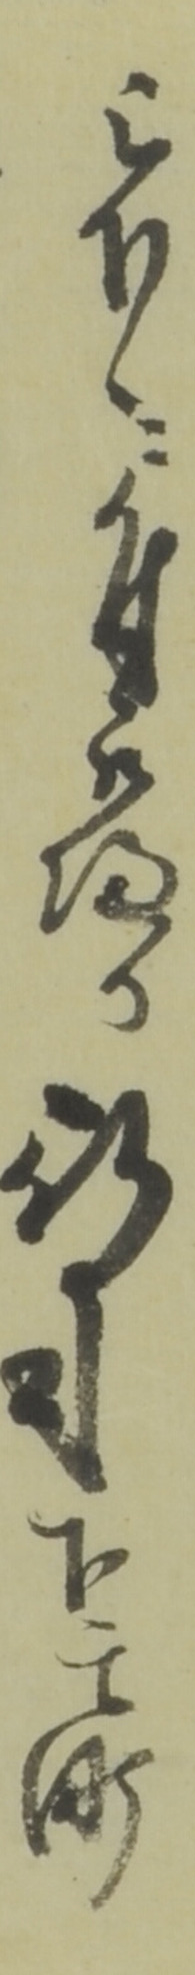被下候ニ付候帰り行司下モ町
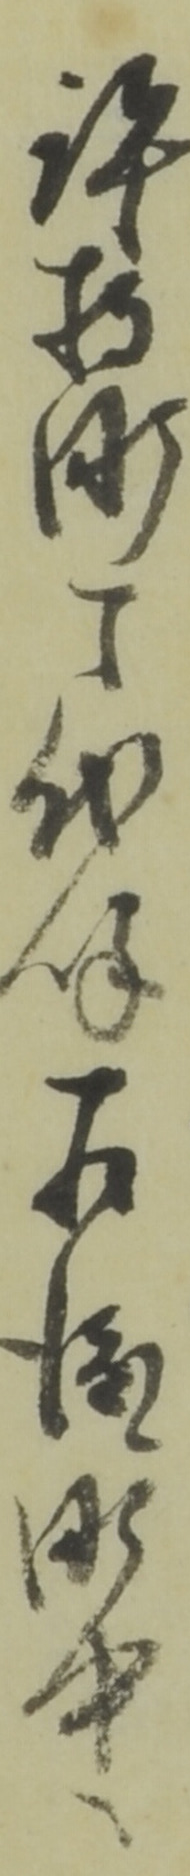鉾持町丁代呼相渡候町中へ
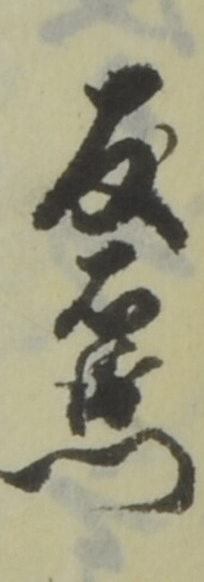友右衛門
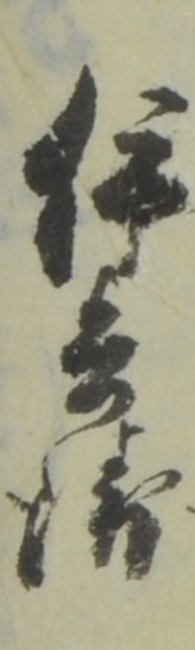伊兵衛

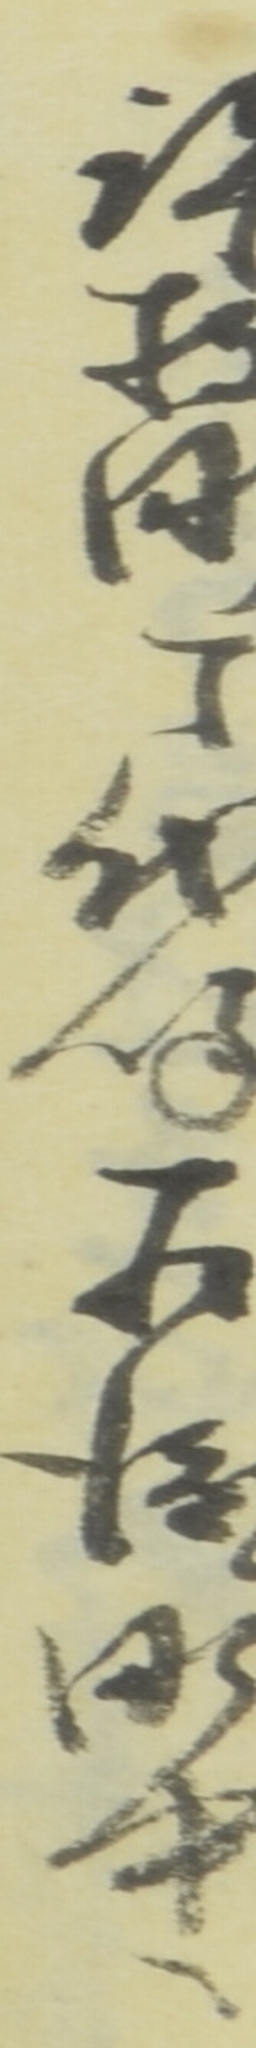鉾持町丁代呼相渡候町中へ
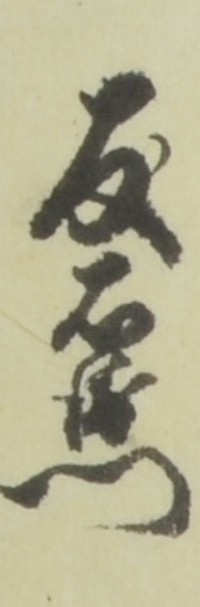友右衛門
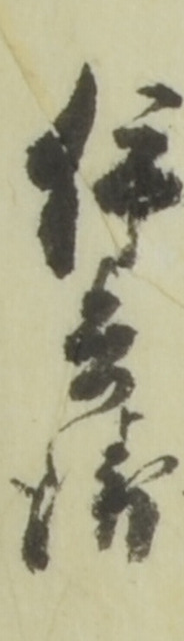伊兵衛
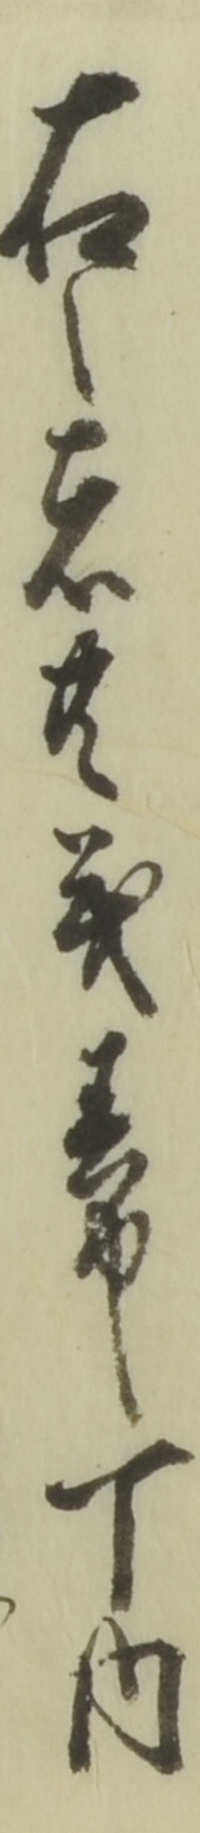右之者共義春中丁内
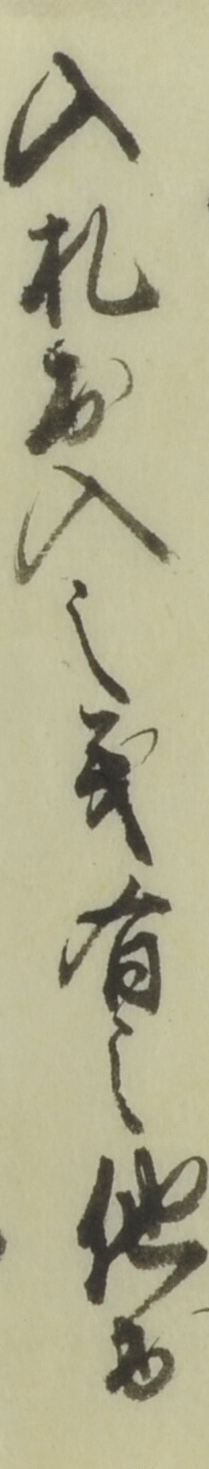入札出入之義有之他出
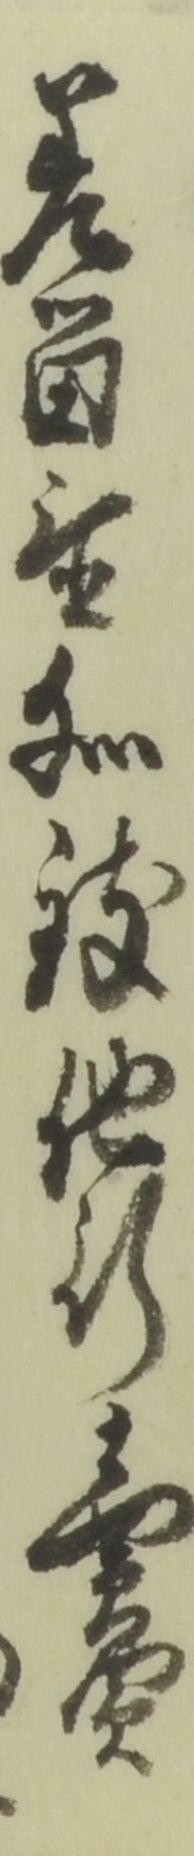差留置処致他行商売
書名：御触書御書附控
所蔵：伊那市立高遠町図書館・合同会社AMANE
